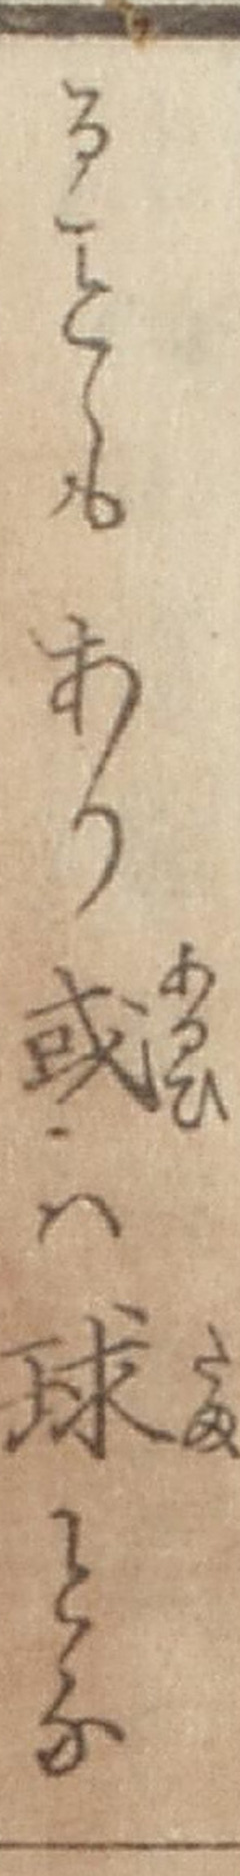ることもあり或は球とな
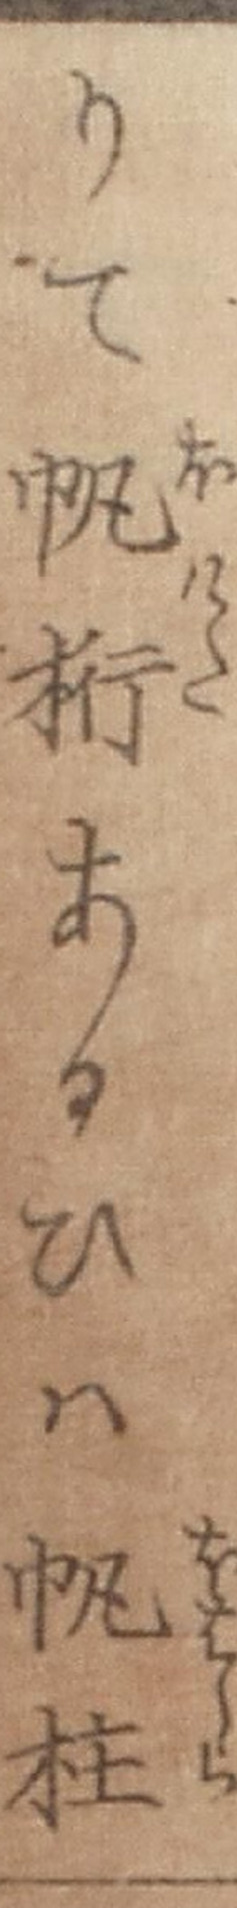りて帆桁あるひは帆柱
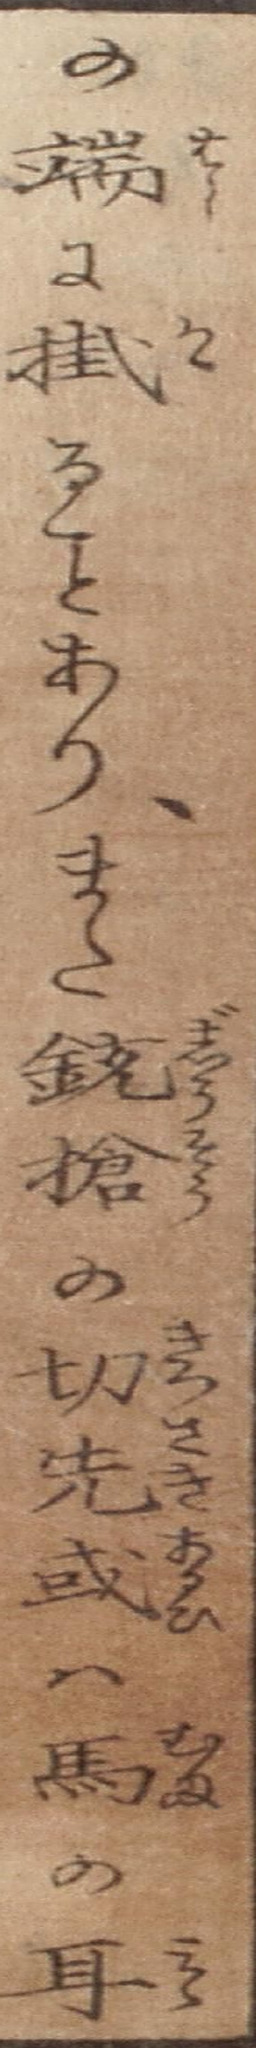の端に掛ることあり、また銃搶の切先或は馬の耳
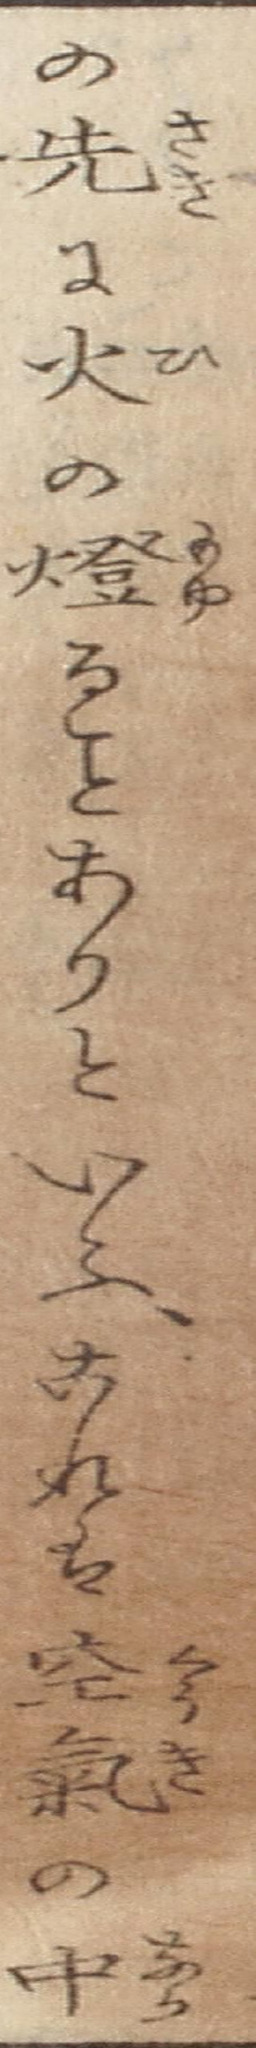の先に火の燈ることありといふ、これは空気の中
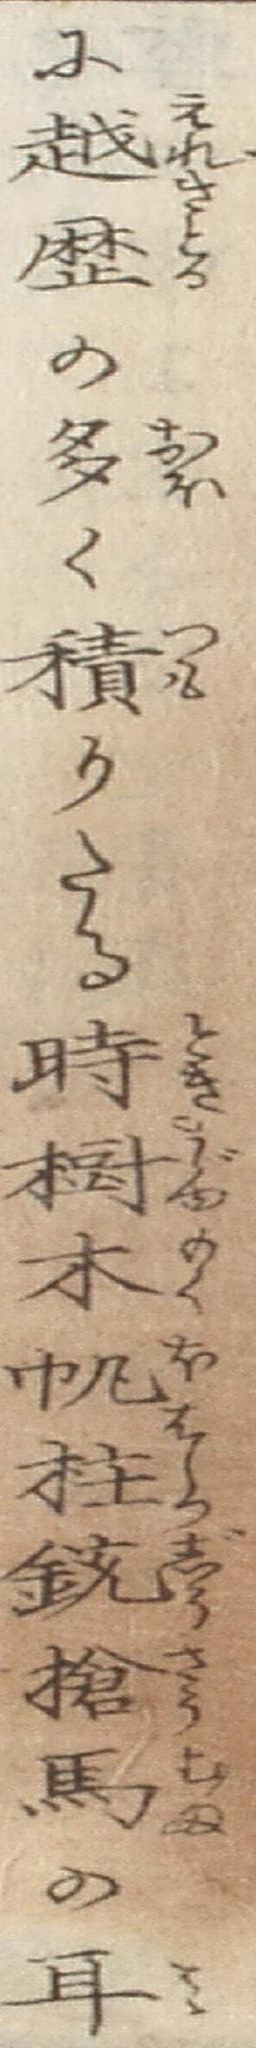に越歴の多く積りたる時。樹木帆柱銃搶馬の耳
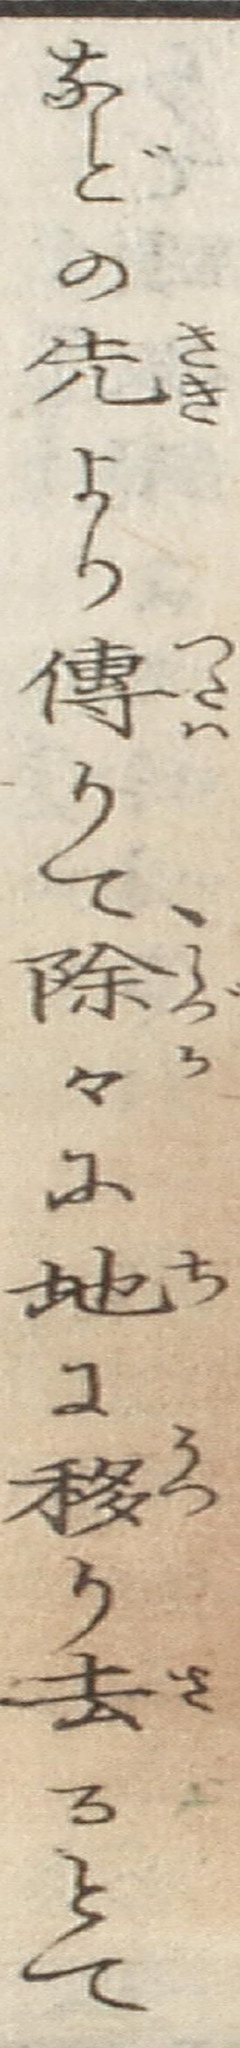などの先より伝りて、除々に地に移り去るとて
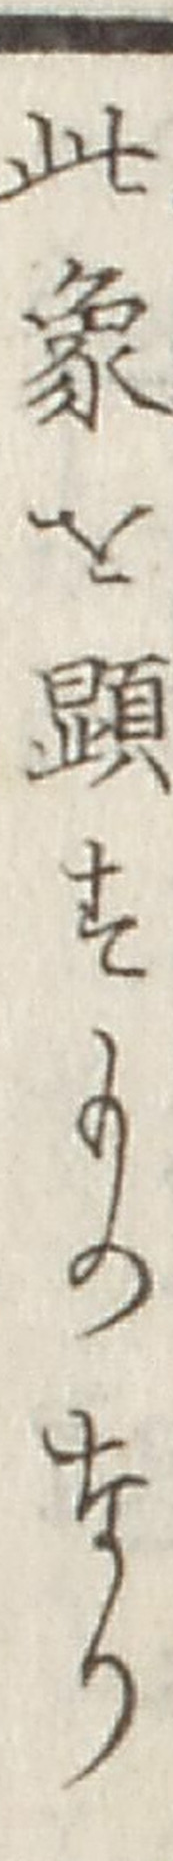此象を顕すものなり
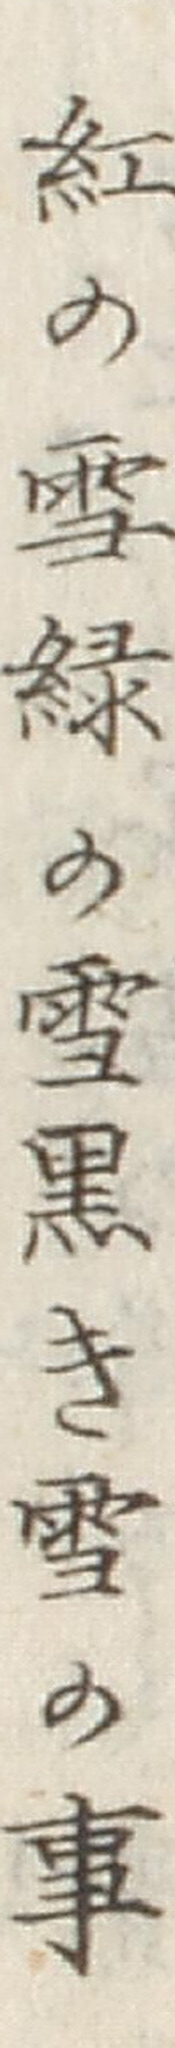紅の雪緑の雪黒き雪の事
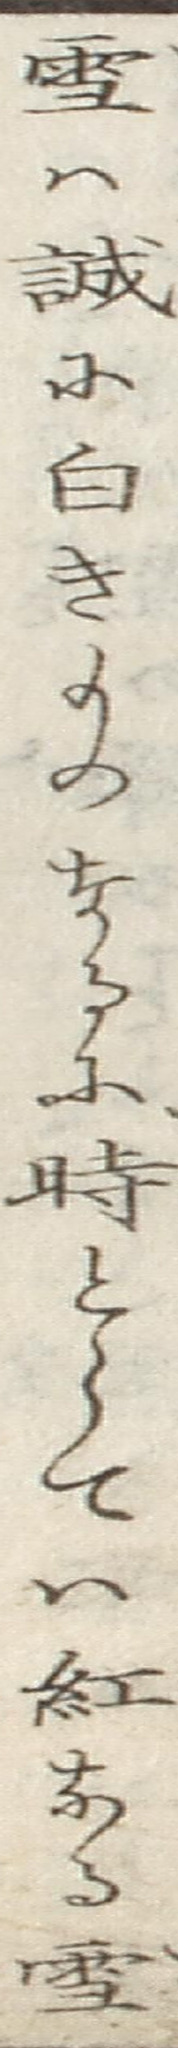雪は誠に白きものなるに、時としては紅なる雪
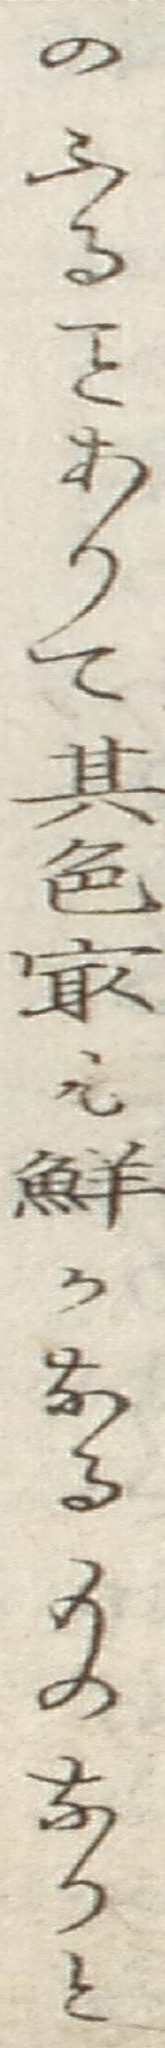のふることありて、其色最も鮮かなるものなりと
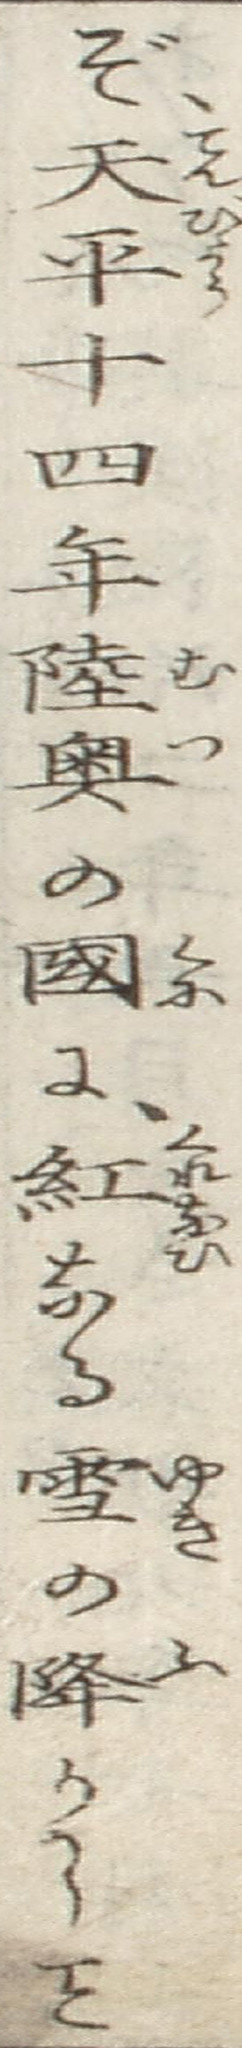ぞ、天平十四年陸奥の国に、紅なる雪の降りしこと

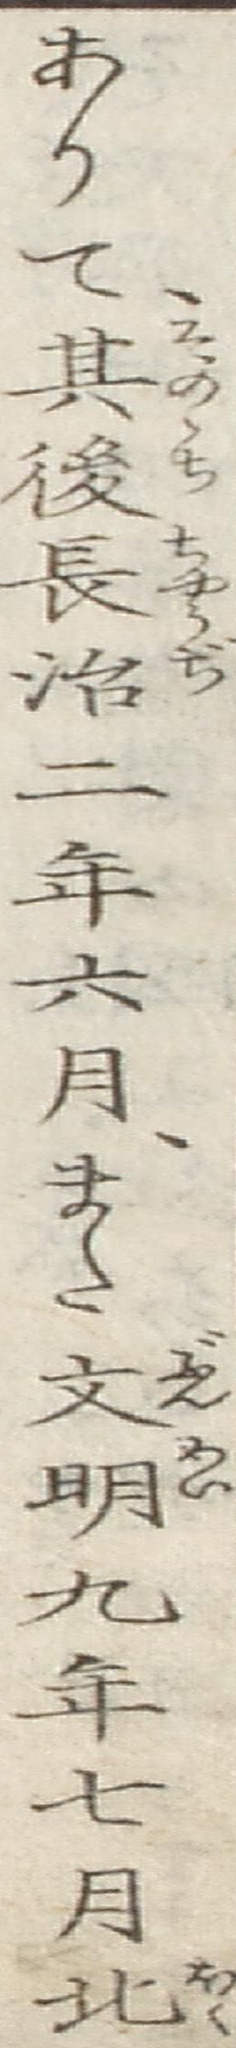ありて、其後長治二年六月、また文明九年七月北
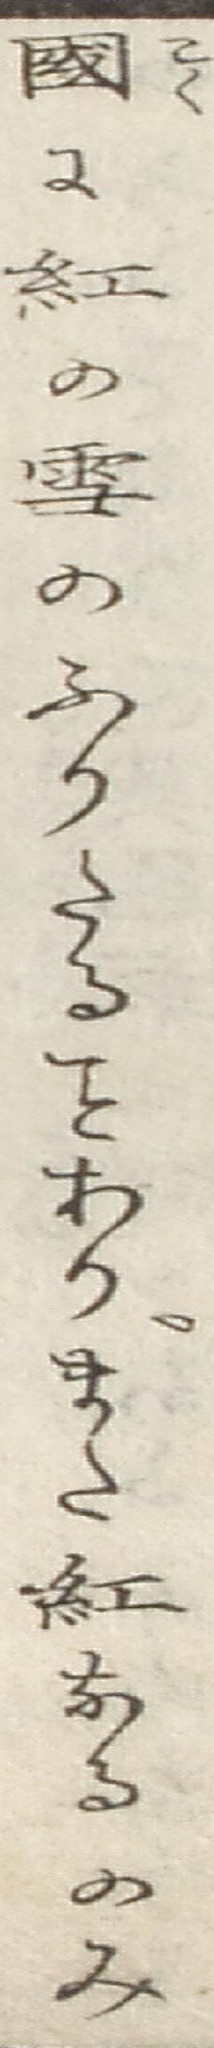国に紅の雪のふりたることあり。また紅なるのみ
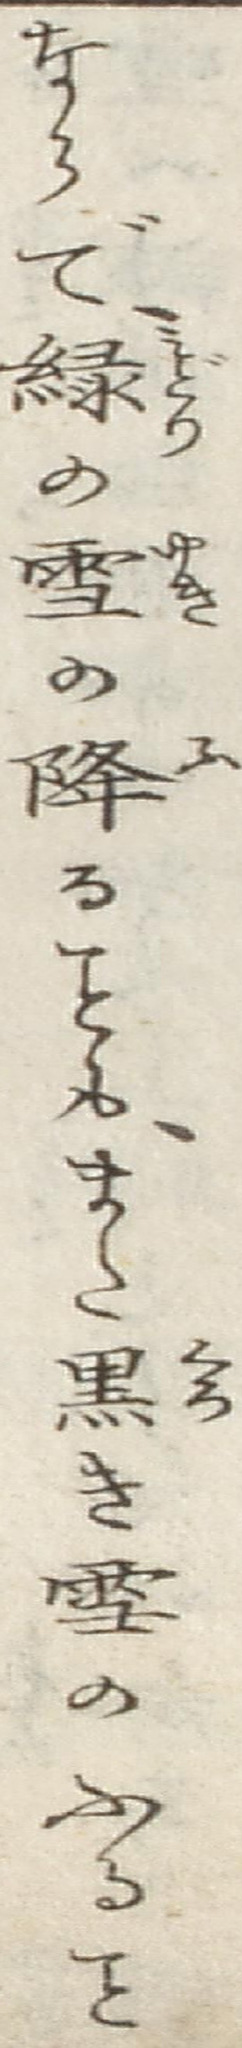ならで、緑の雪の降ることも、また黒き雪のふること
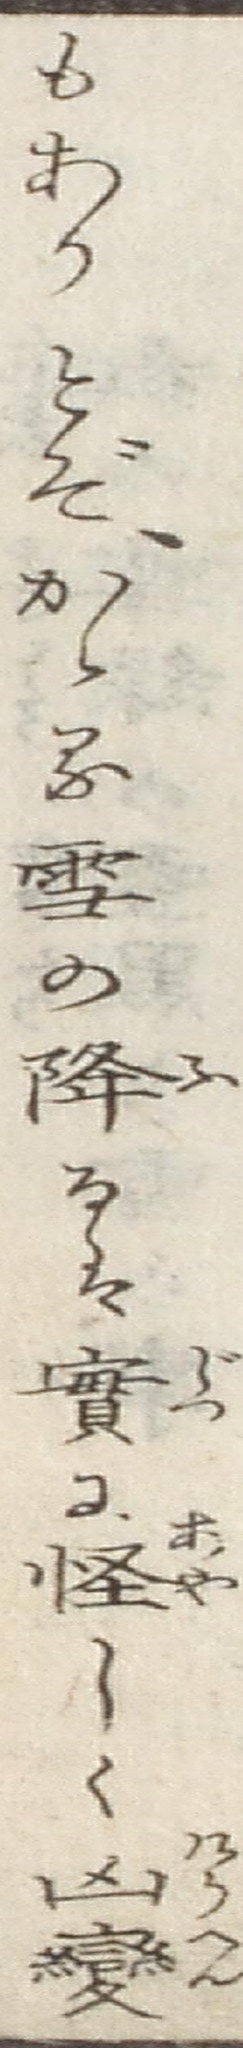もありとぞ、かゝる雪の降るは実に怪しく凶変
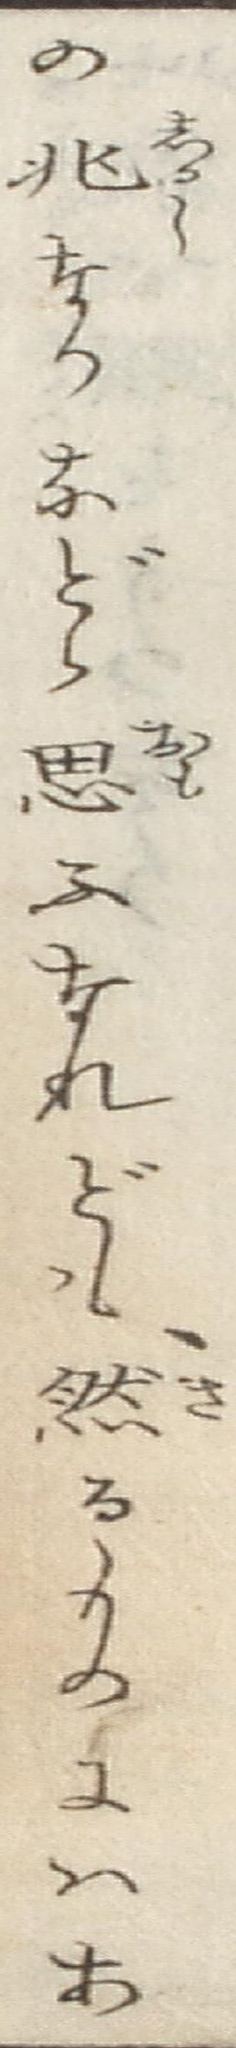の兆なりなどゝ思ふなれども、然るものにはあ
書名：変異辯　一名、天變地異拾遺　全
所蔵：東京大学地震研究所図書室 Earthquake Research Institute Library, The University of Tokyo, JAPAN
